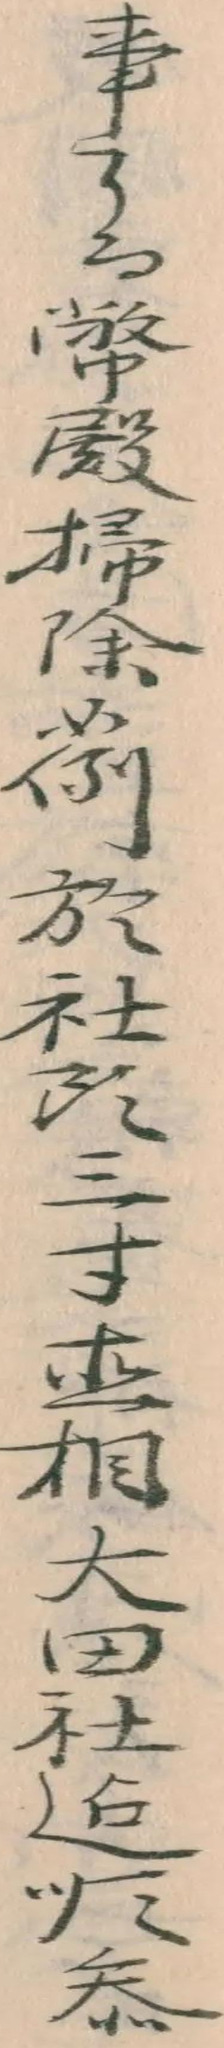事了而幣殿掃除如例於社頭三寸直相大田社迄順参
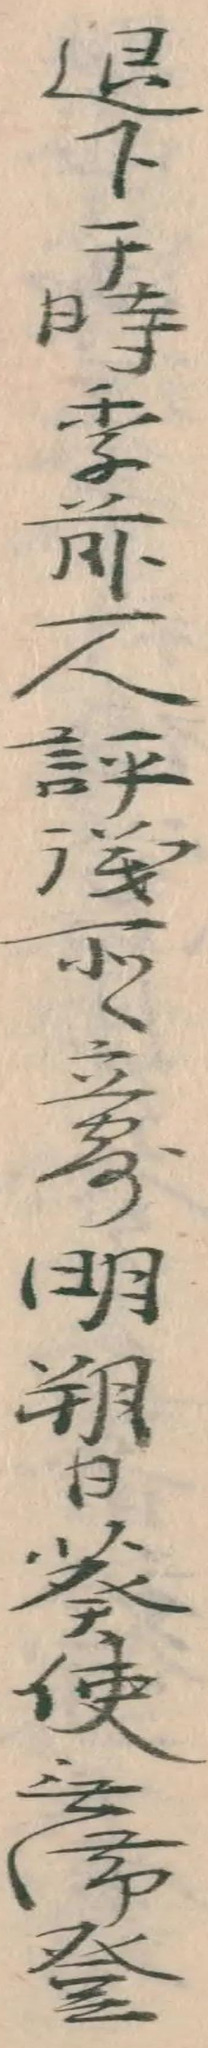退下于時季前一人評議所へ立寄明朔日葵使無滞登
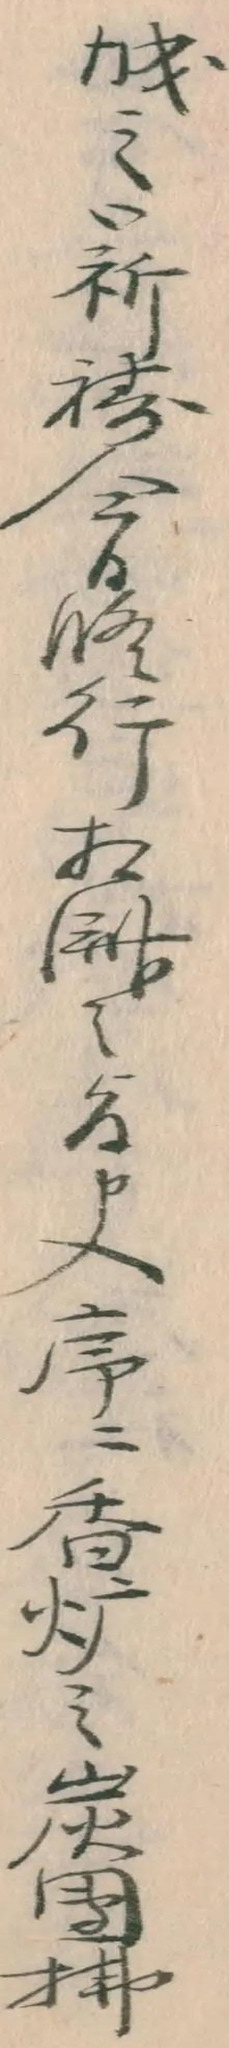城之御祈祷今日修行相済之旨申入序ニ香炉之炭団払
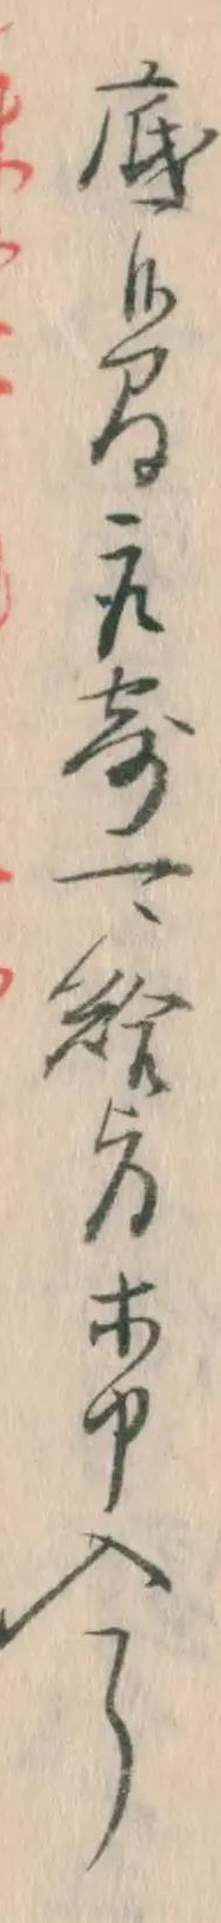底候間取寄可給旨等申入了
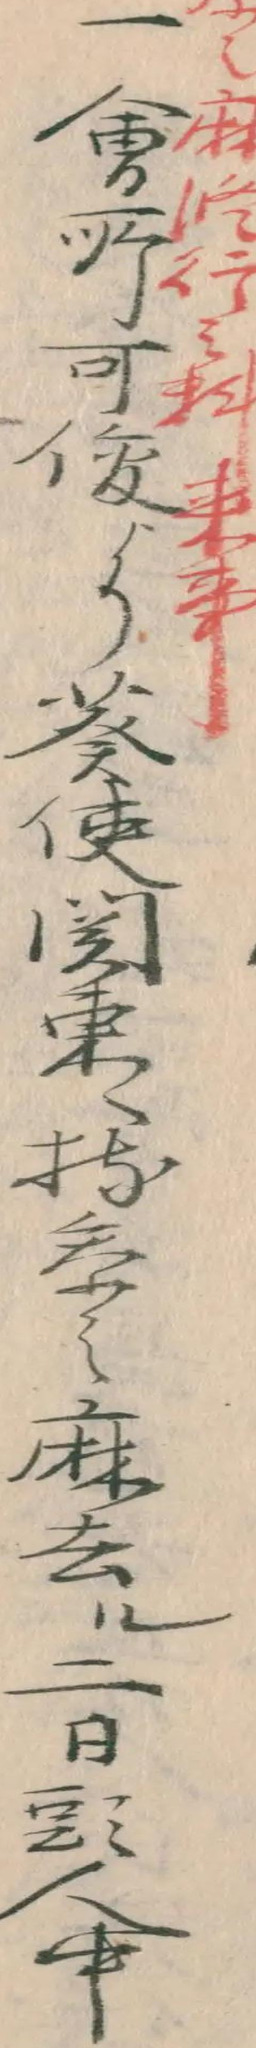一會所可俊より葵使関東へ持参之麻去ル二日頭人中
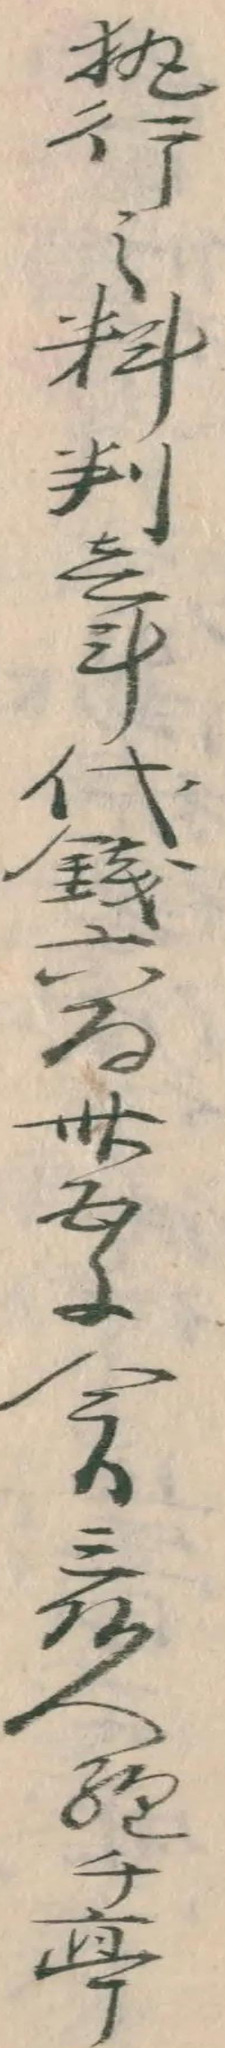執行之料判壱斗代銭六百卅五文今日三頭人経千亭
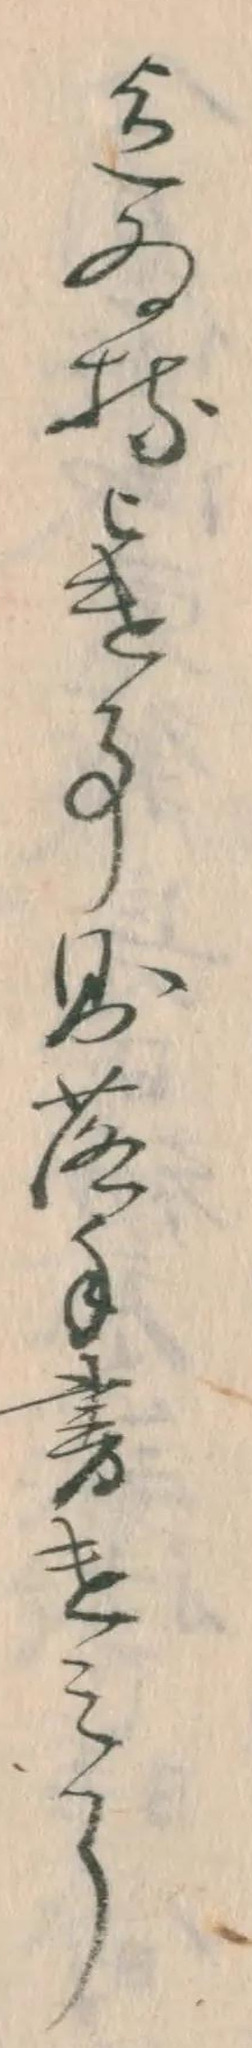迄為持被遣事則落手書遣之に
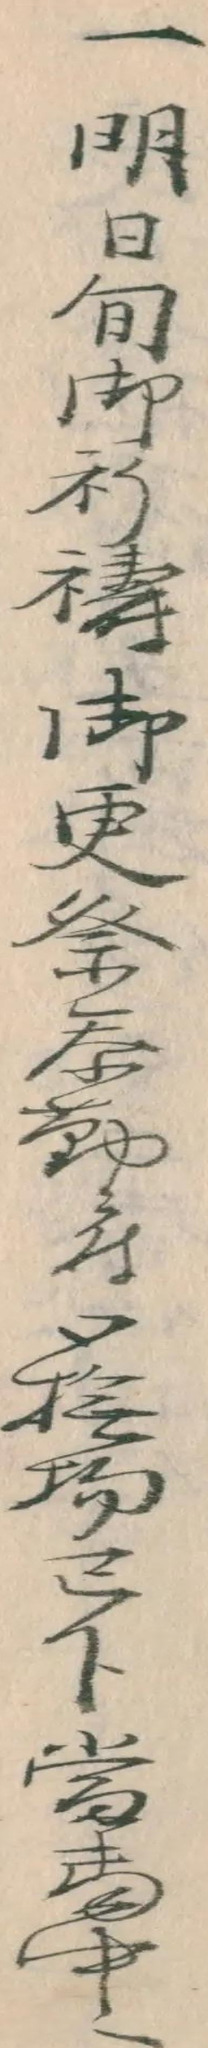一明日旬御祈祷御更祭祭参勤ニ付御撫物已下當番中へ
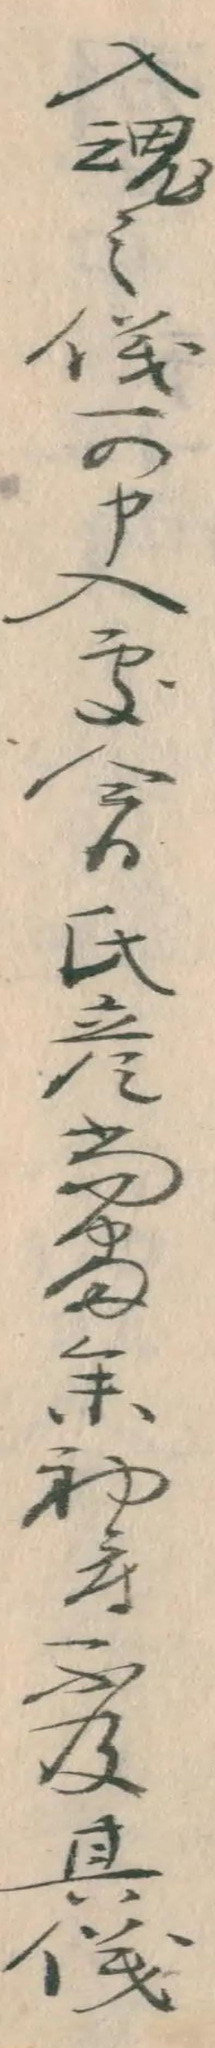入魂之儀可申入處今日氏彦當番参初ニ付不及其儀
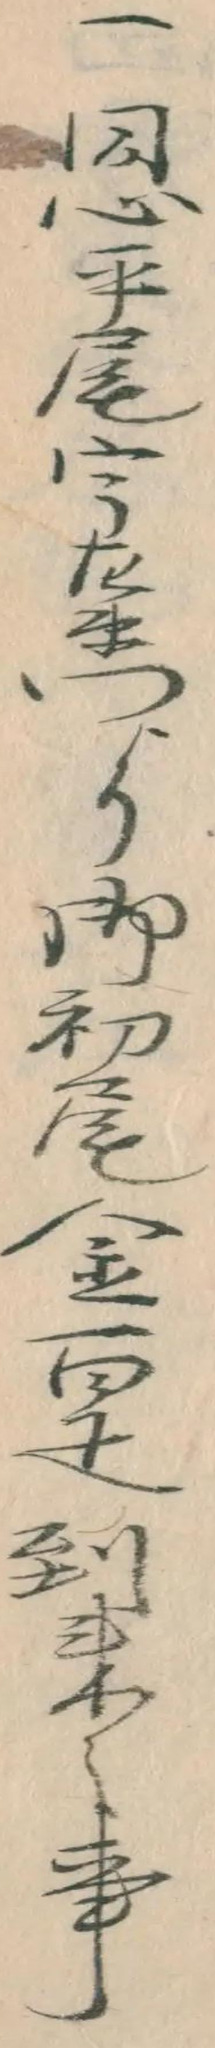一同心平尾宇左衛門より御初尾金百疋到来之事

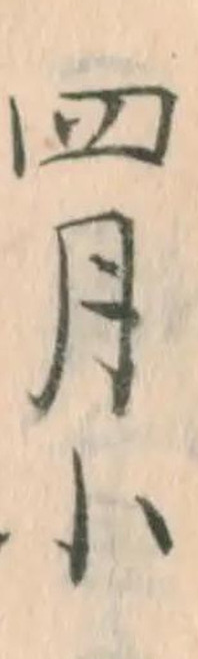四月小
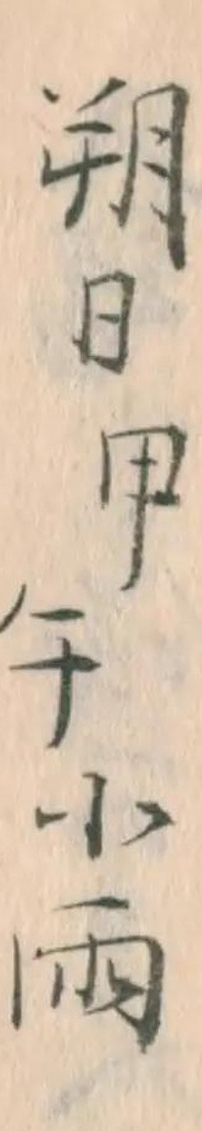朔日甲午小雨
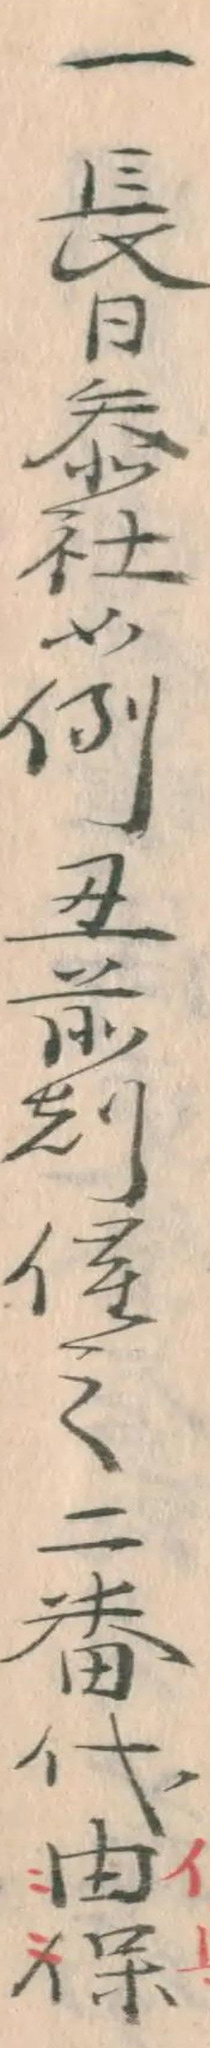一長日参社如例丑前刻催之二番代由保
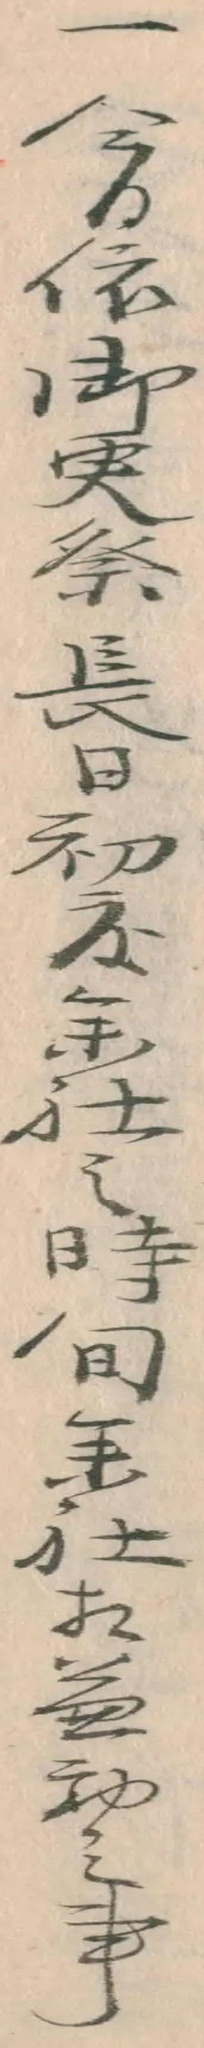一今日依御更祭長日初度参社之時旬参社相兼勤之事
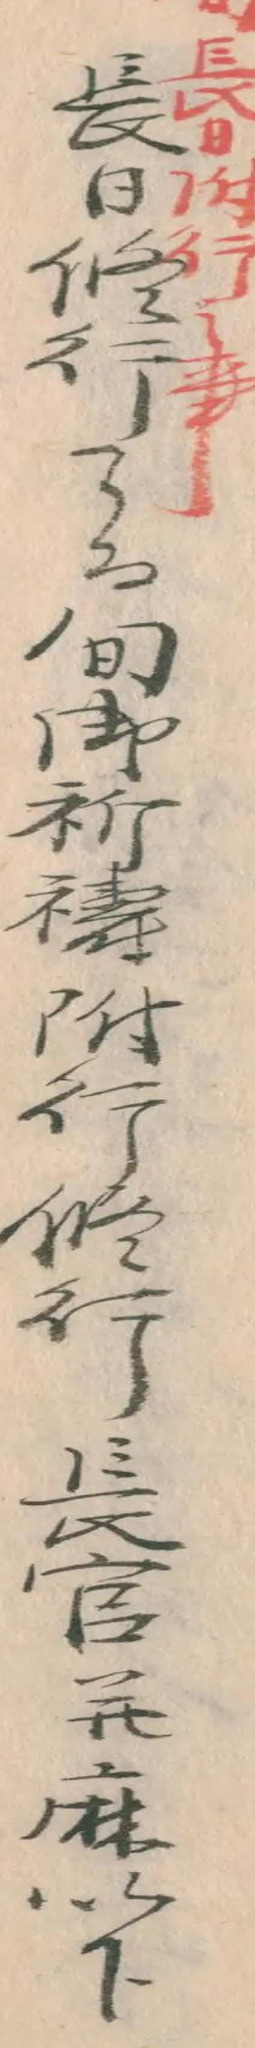長日修行了而旬御祈祷附行修行長官并麻以下
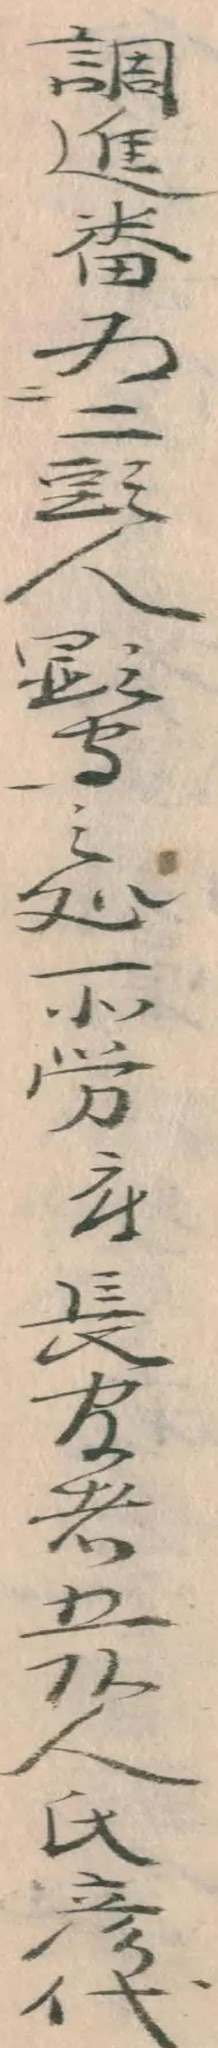調進番為二頭人顕守之処所労ニ付長官者五弐人氏彦代
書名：賀茂社記録. 第73冊
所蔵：国立国会図書館 National Diet Library, JAPAN
